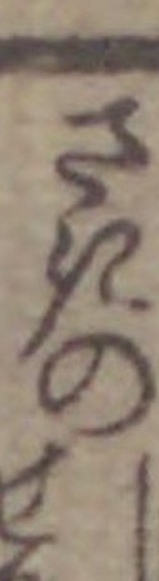さきの
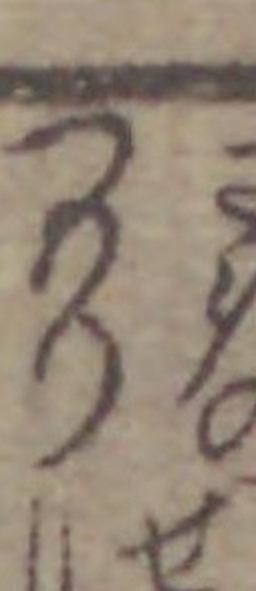つもり
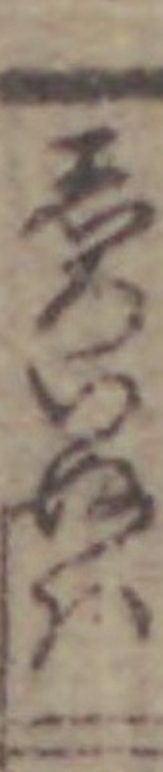しろいぬは
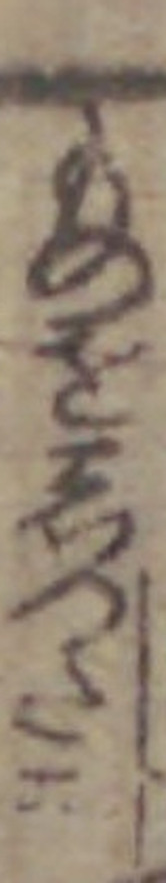ものをしつた
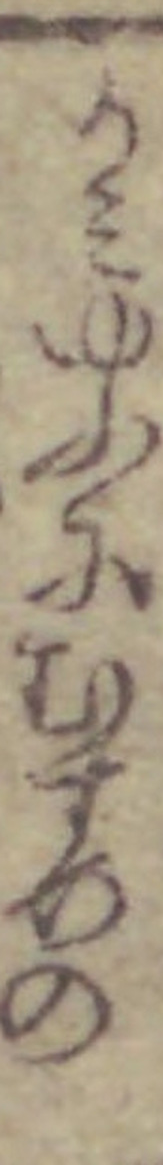かみゆふにむすめの
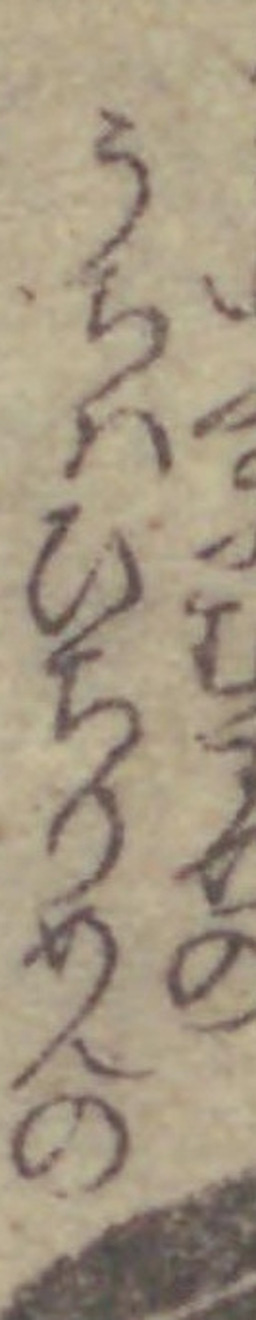うちはひちりめんの
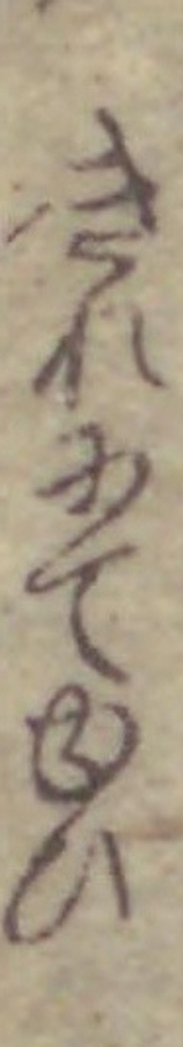きれにてゆひ
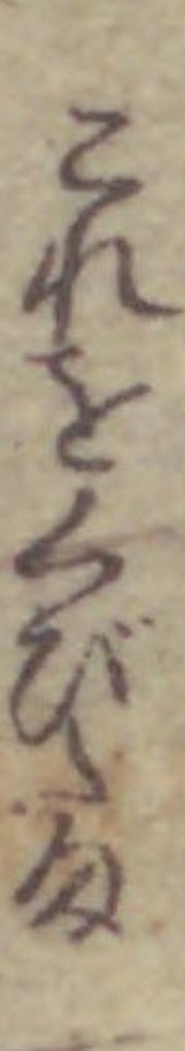これをくびたま
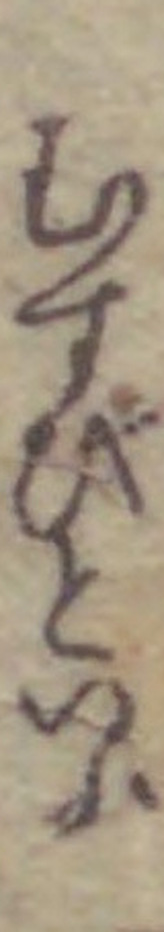むすびといふ
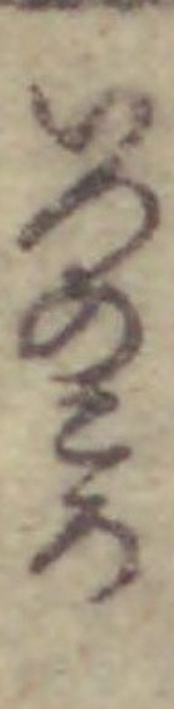いつのころ
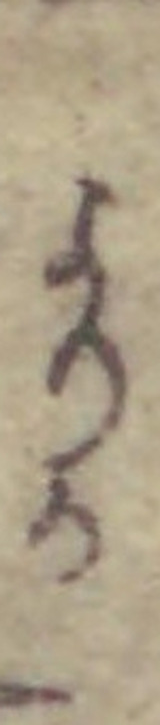よりか
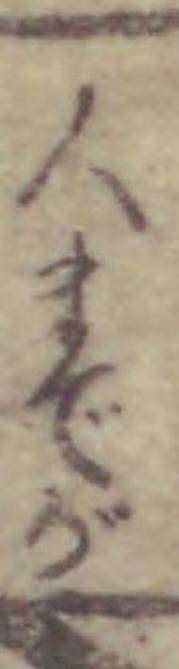人までが
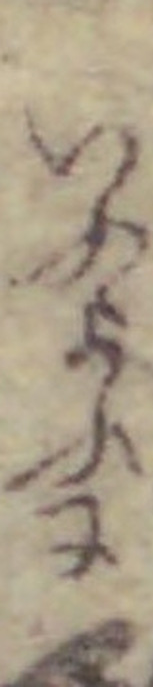いふよふに

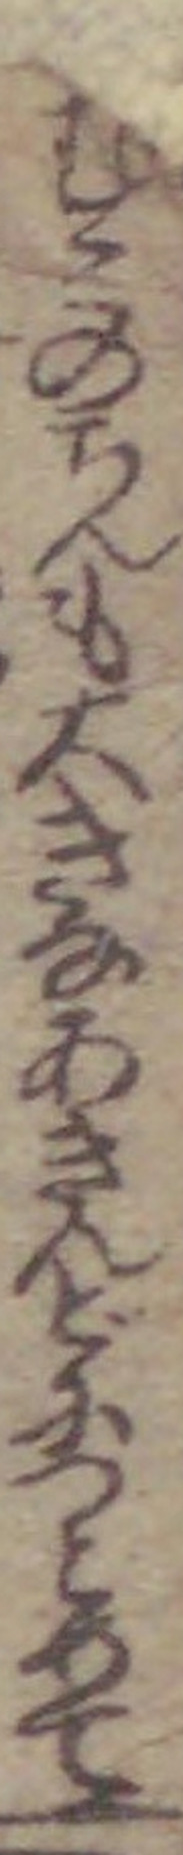むこのちんも大きなあきんどにつとめて
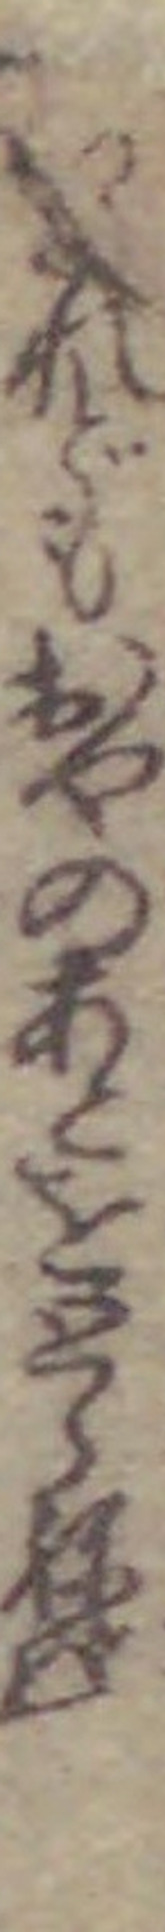いれどもおやのあとをとらねば
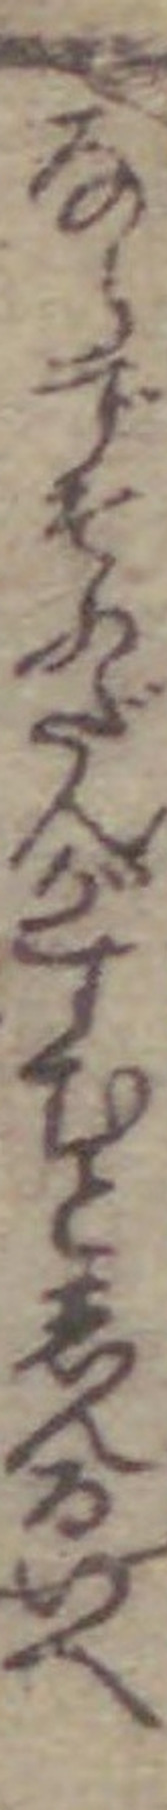ならずそふだんがすむとしんるいへ
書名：狆の嫁入 2巻
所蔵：国立国会図書館 National Diet Library, JAPAN
